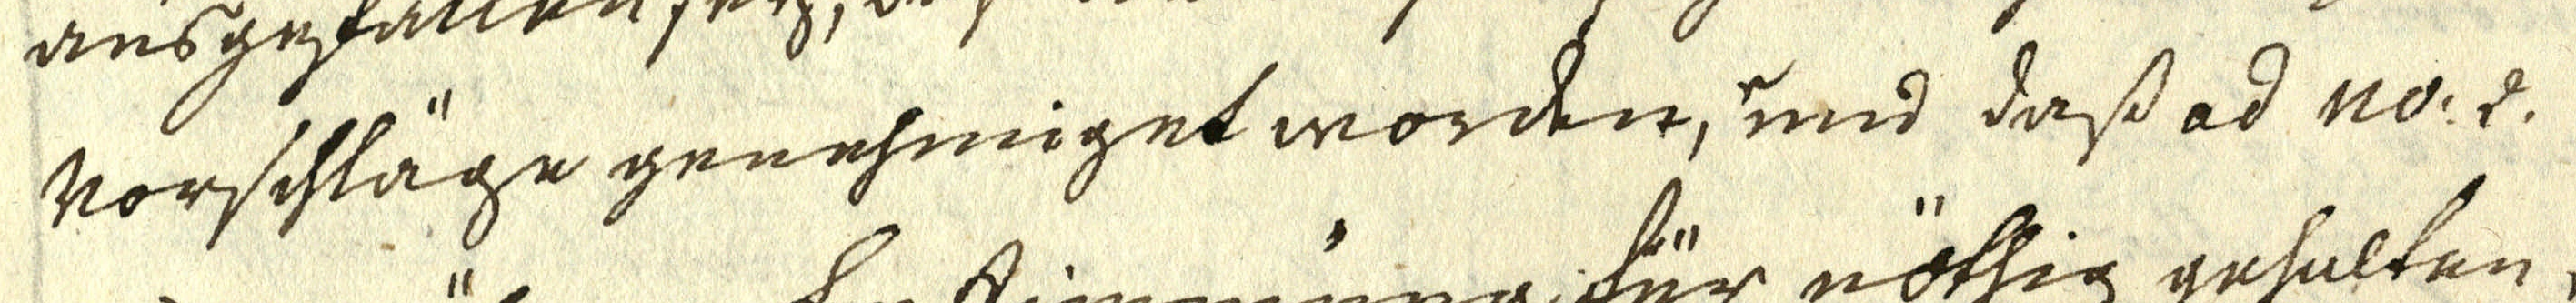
Vorschläge genehmiget worden, und daß ad No. 2.
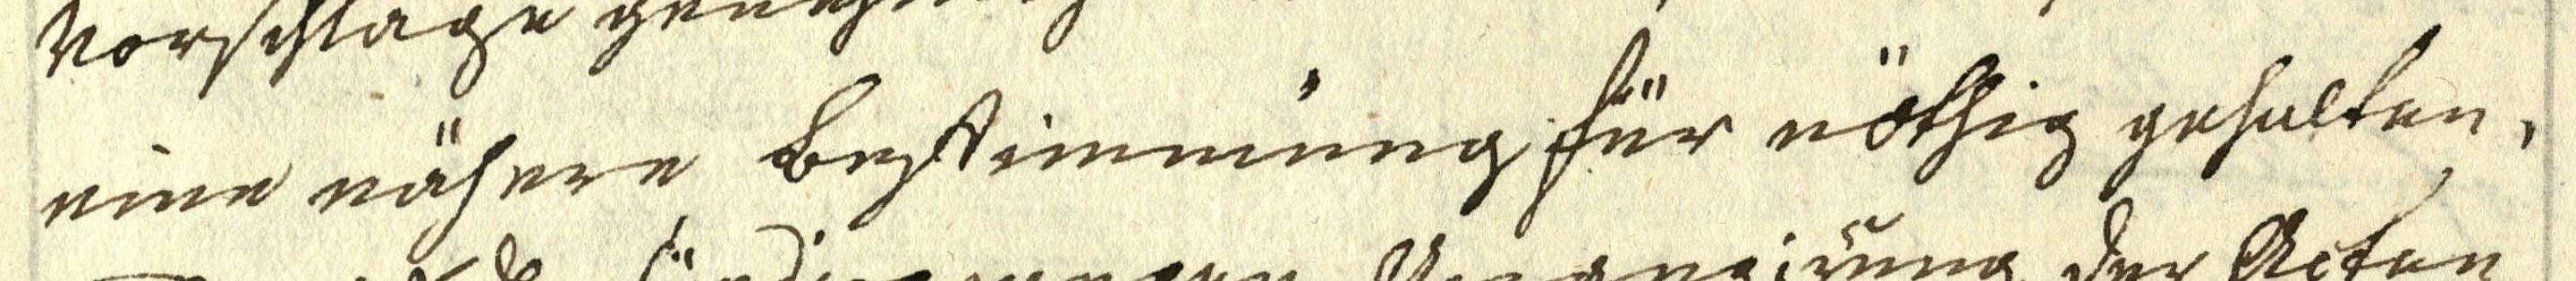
eine nähere Bestimmung für nöthig gehalten,
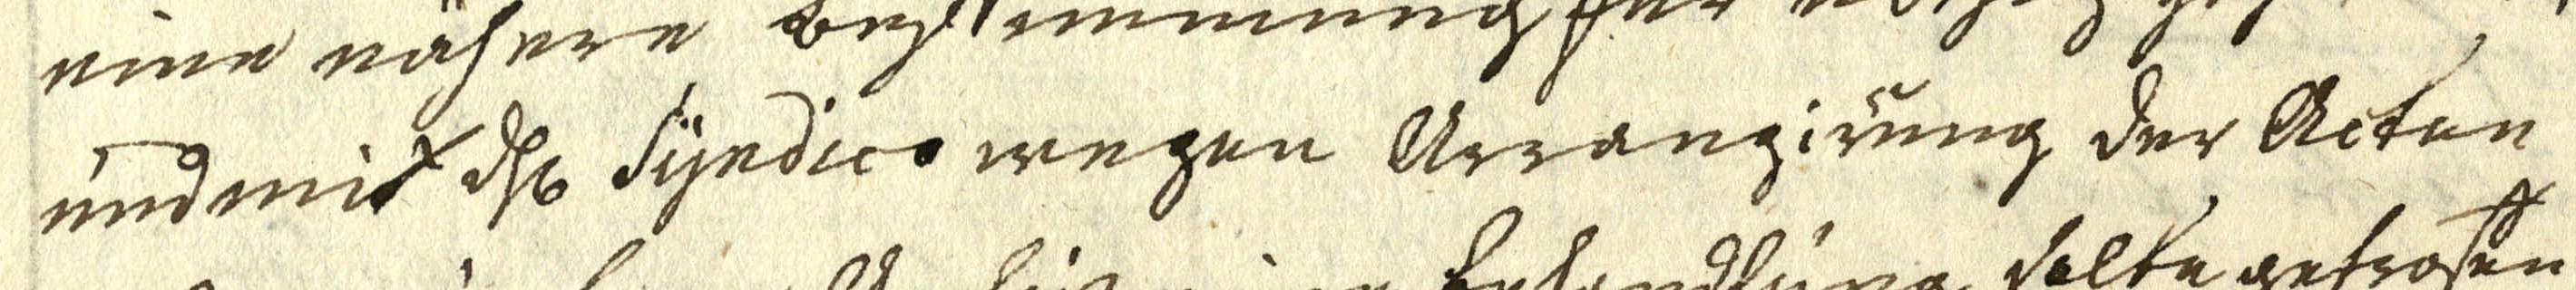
und mit dh Sÿndico wegen Arrangirung der Acten
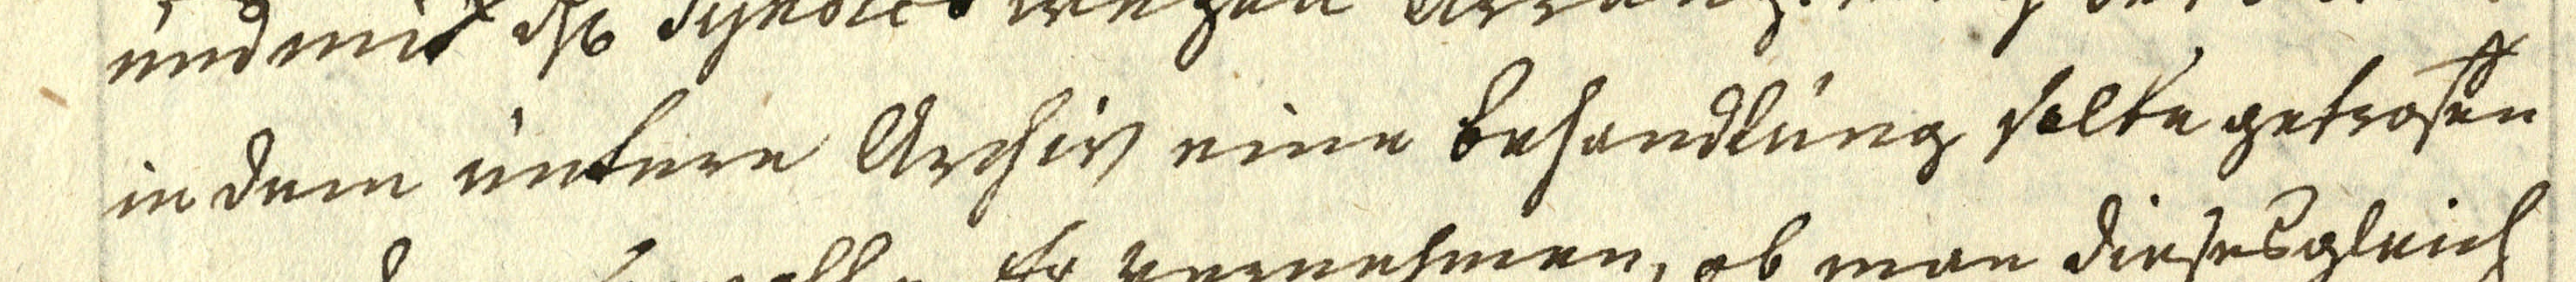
in dem untern Archiv eine Behandlung solte getroffen
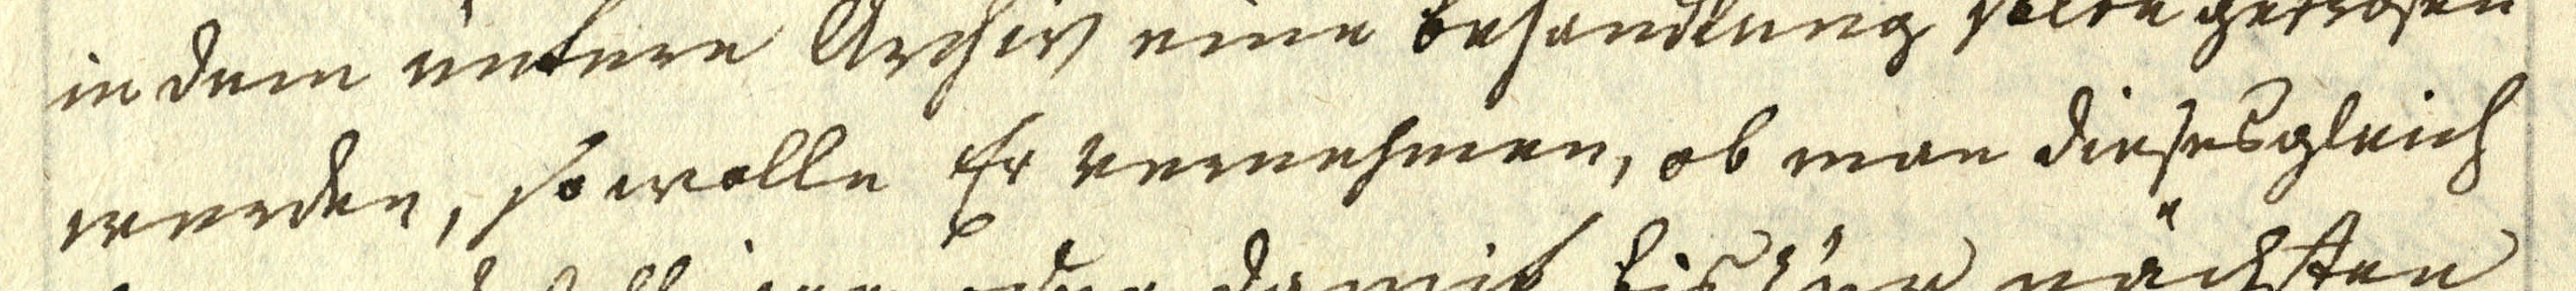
werden, so wolle Er vernehmen, ob man dieses gleich
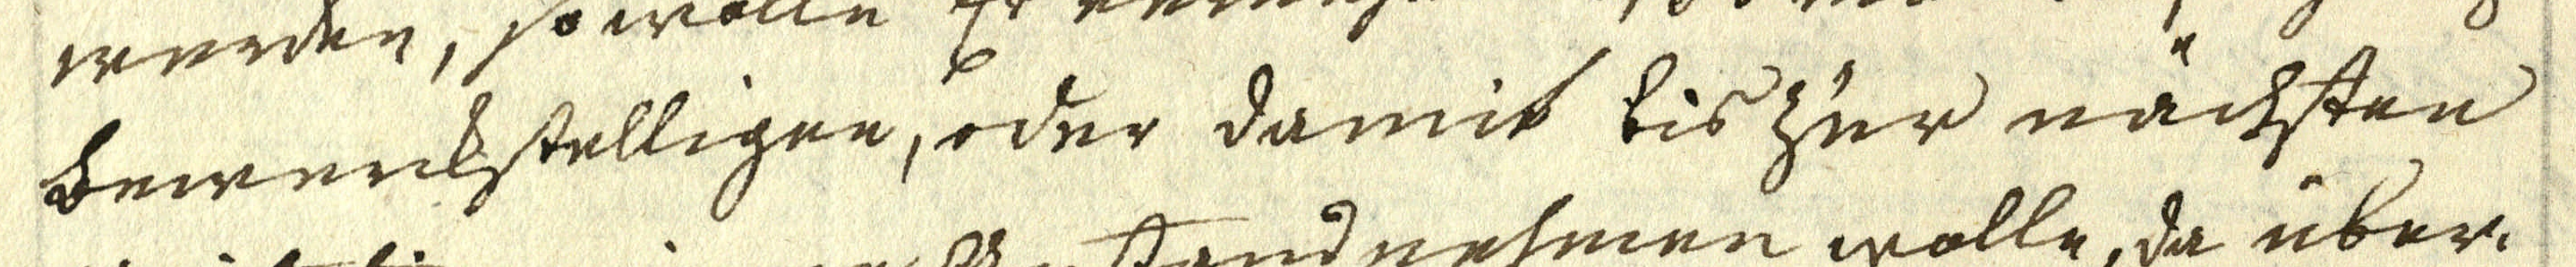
bewerckstelligen, oder damit bis zur nächsten
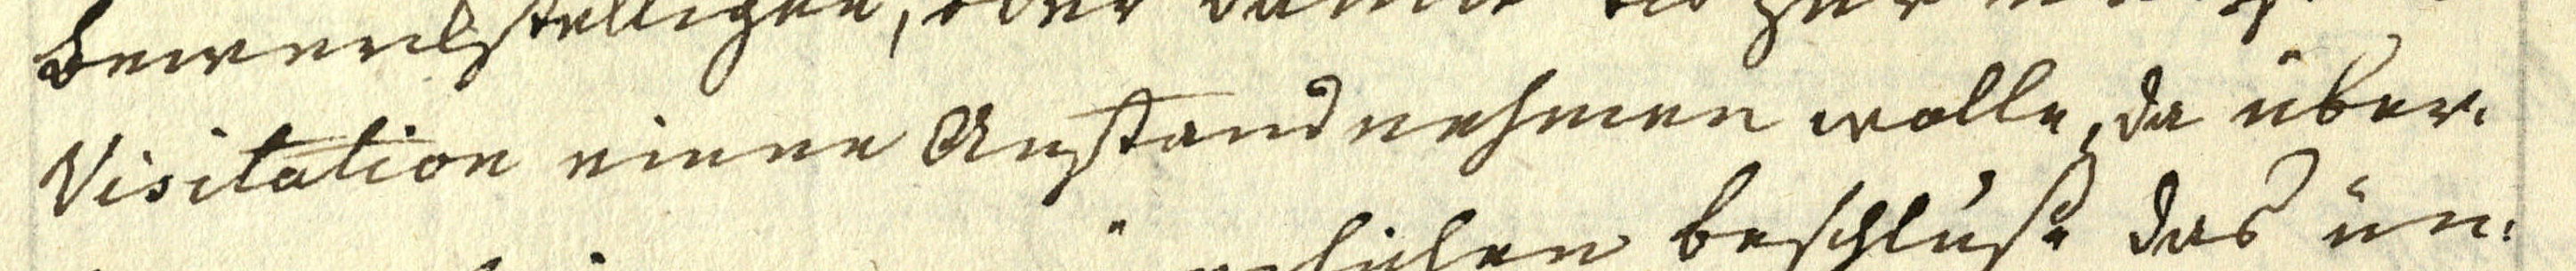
Visitation einen Anstand nehmen wolle, da über¬
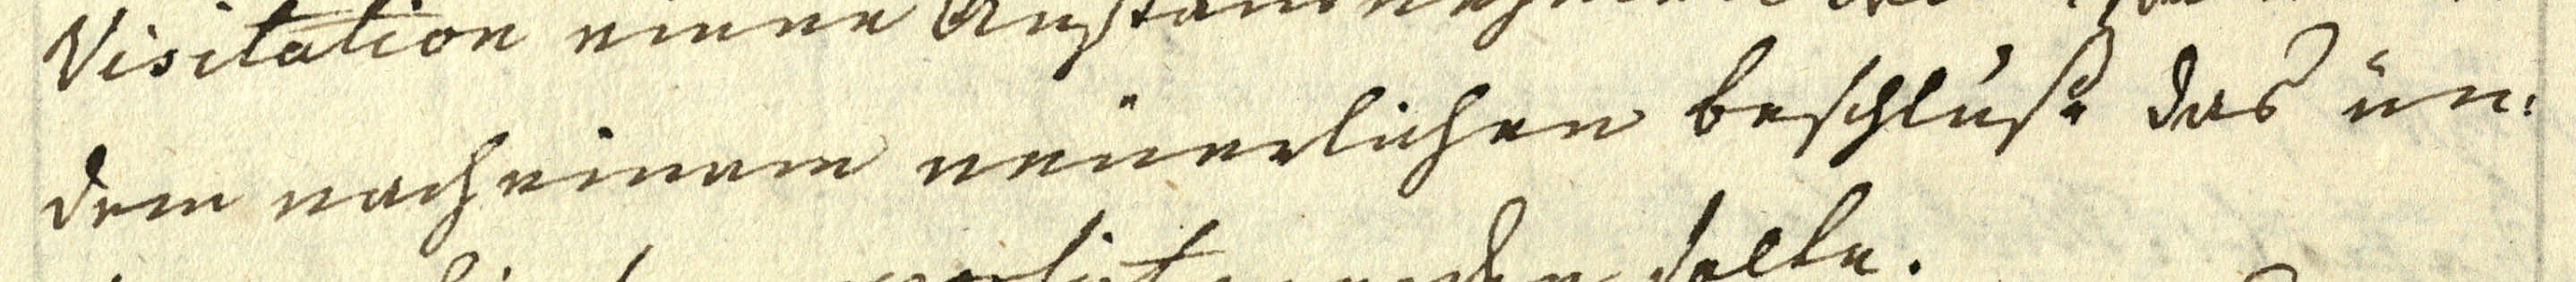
dem nach einem neuerlichen Beschluße das un¬
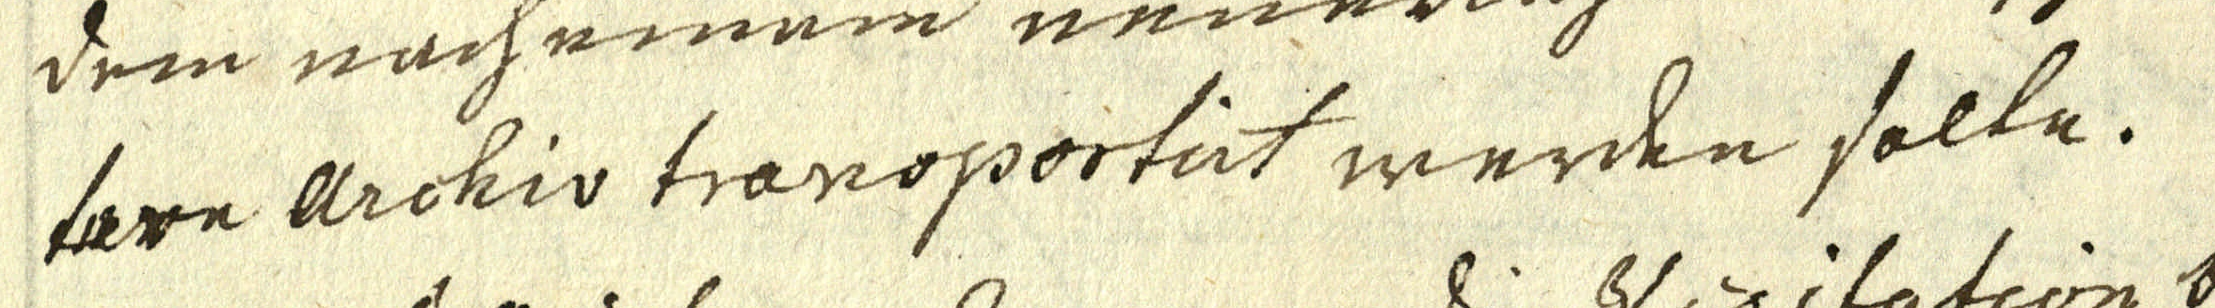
tere Archiv transportirt werden solte.
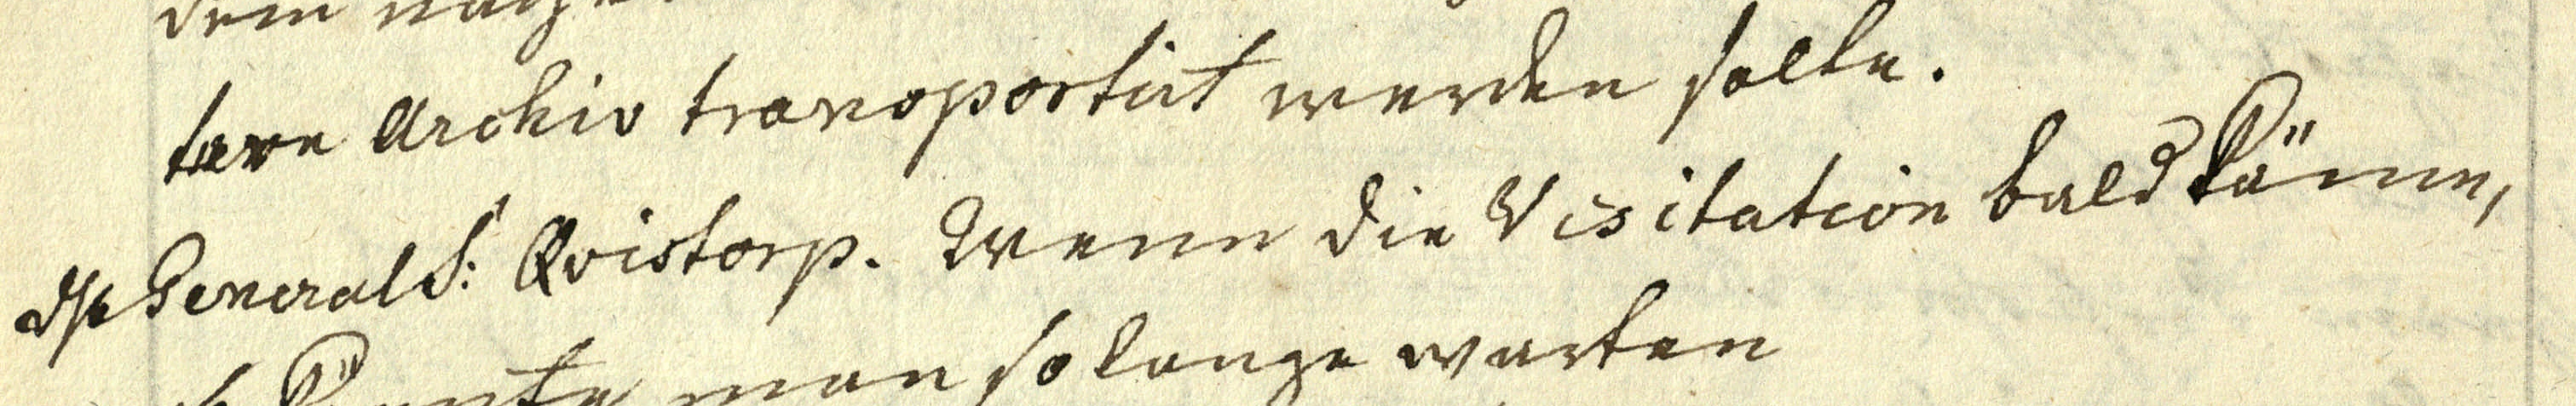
dh GeneralS. Quistorp. Wenn die Visitation bald käme
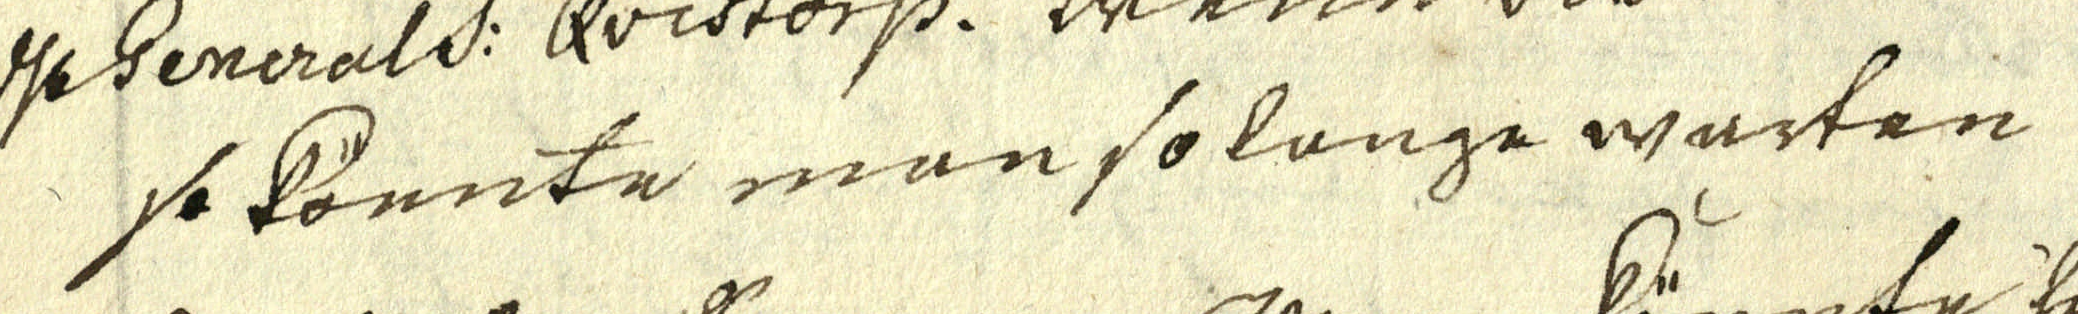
so könnte man so lange warten
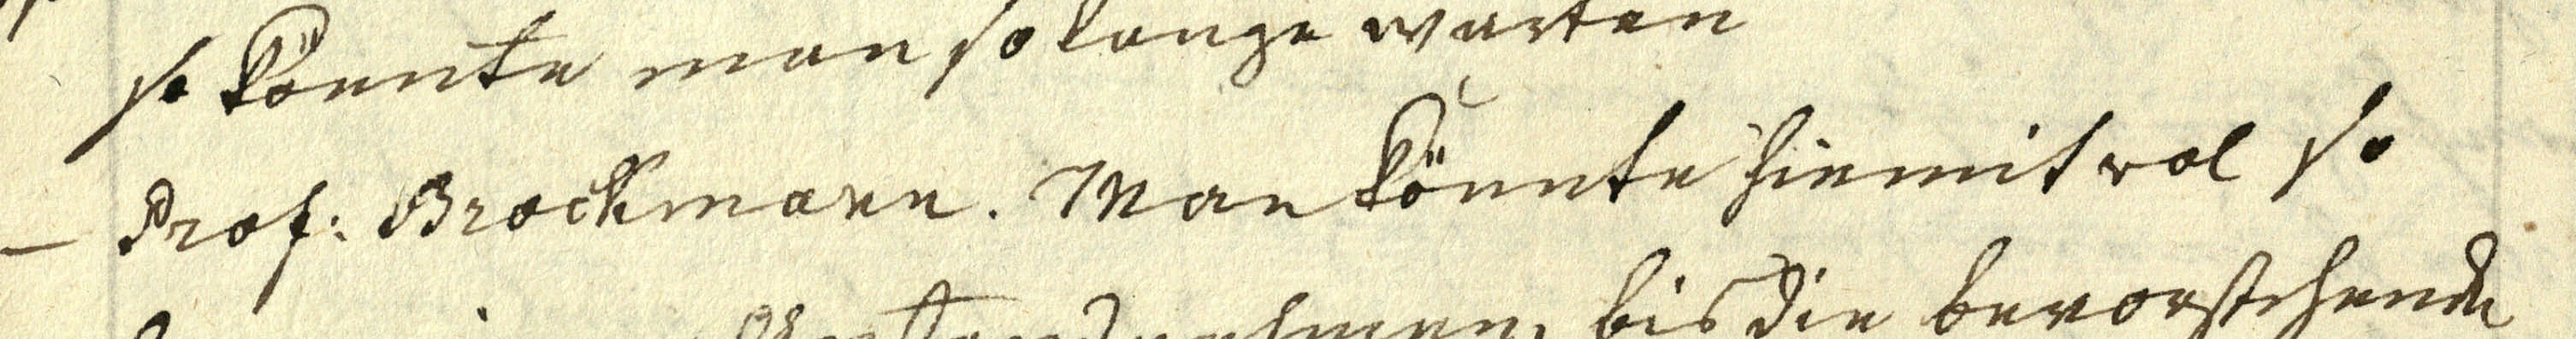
Prof. Brockmann. Man könnte hiemit wol so
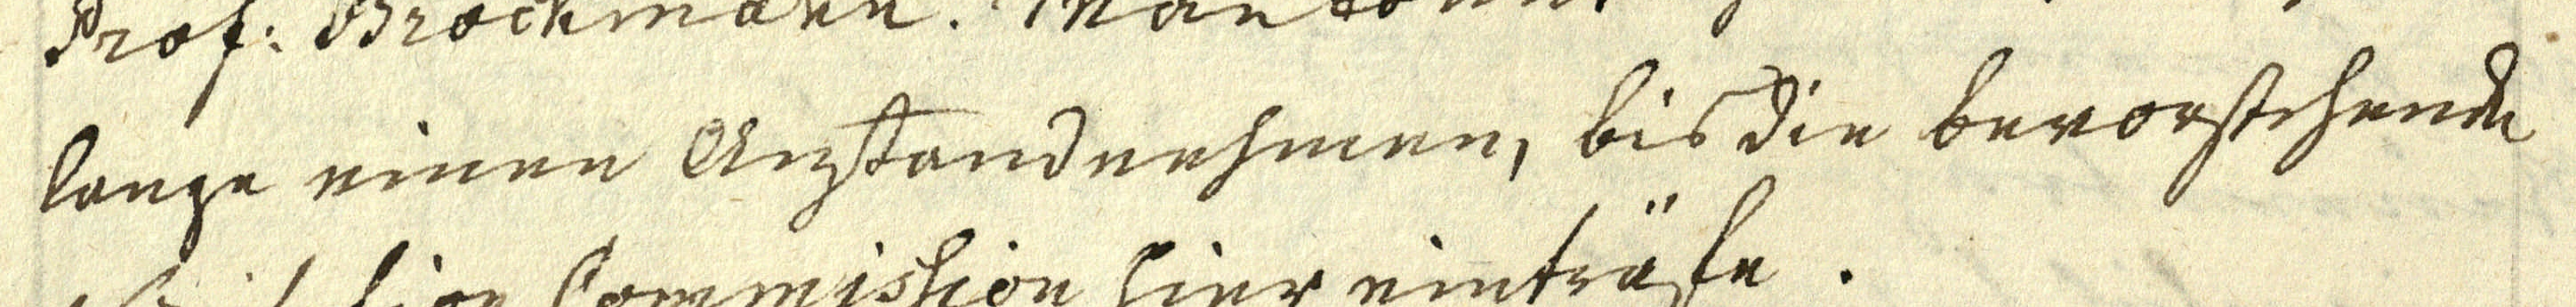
lange einen Anstand nehmen, bis die bevorstehende
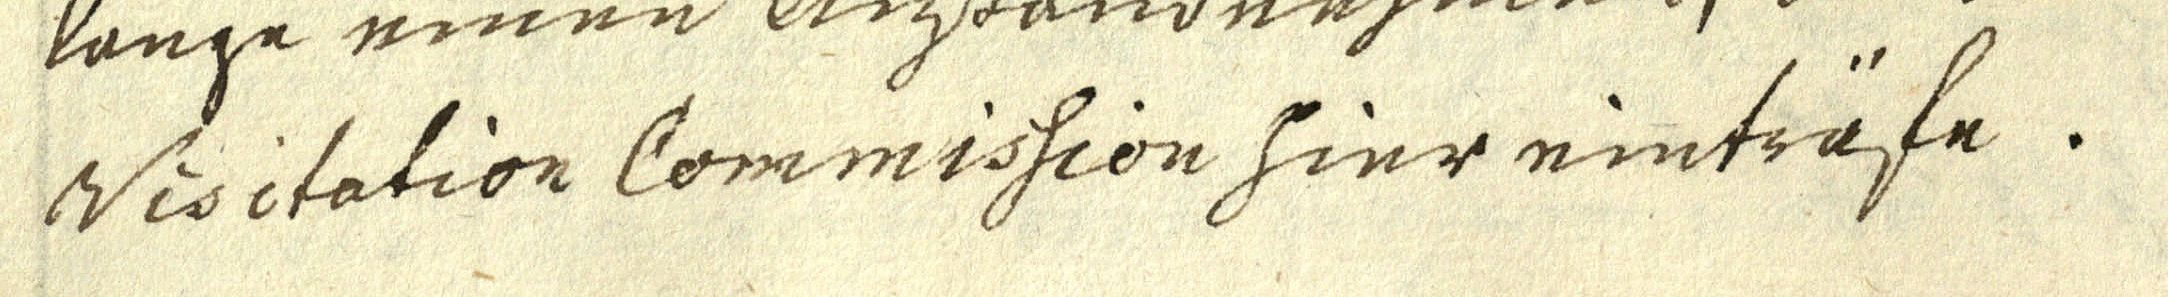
Visitation Commission hier einträfe.
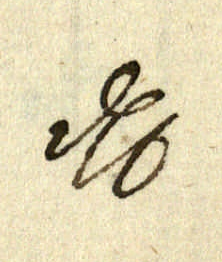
dh
